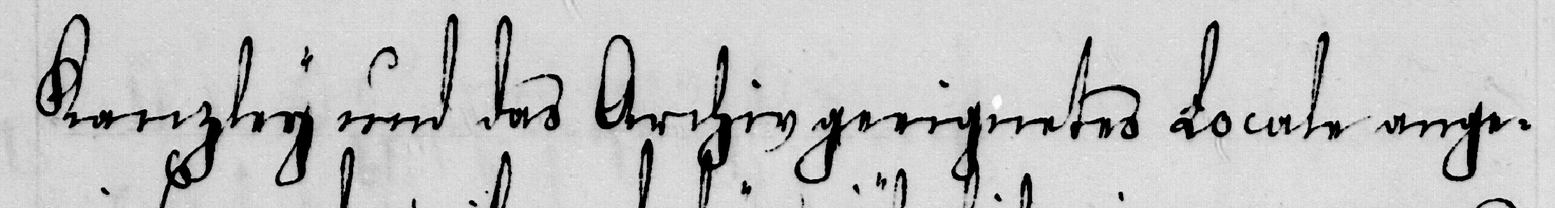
Kanzley und das Archiv geeignetes Locale ange¬
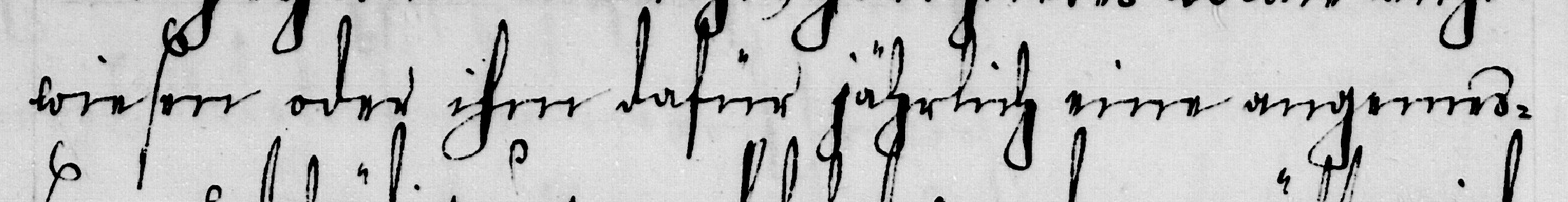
wiesen oder ihm dafür jährlich eine angemeß¬
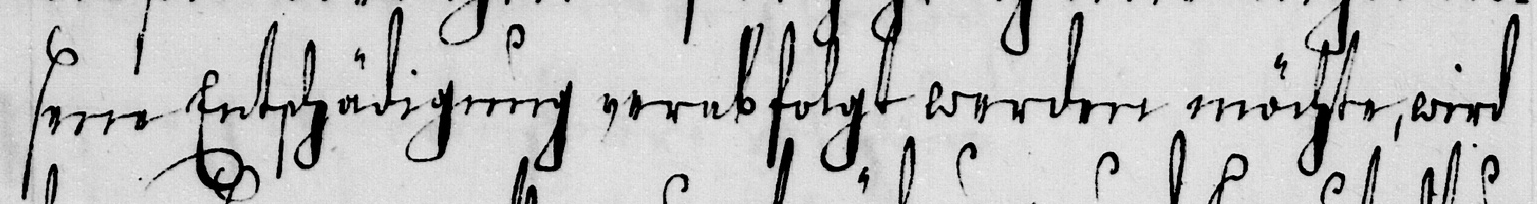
ene Entschädigung verabfolgt werden möchte, wird
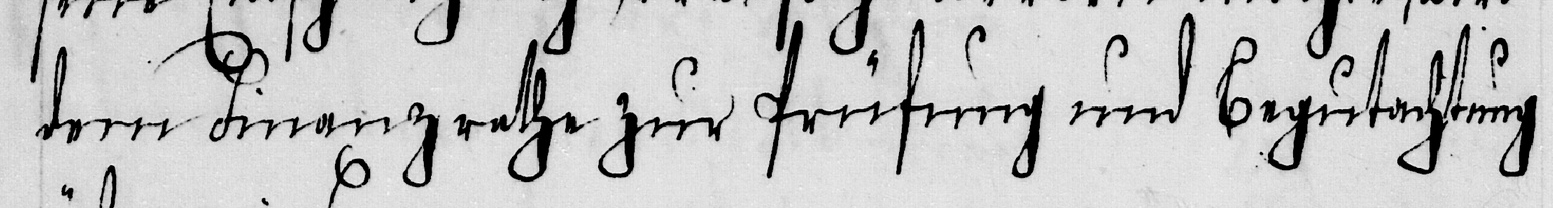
dem Finanzrathe zur Prüfung und Begutachtung
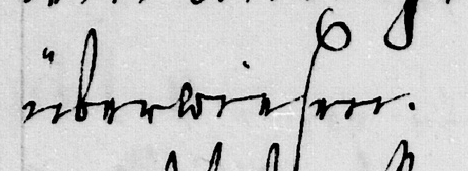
überwiesen.
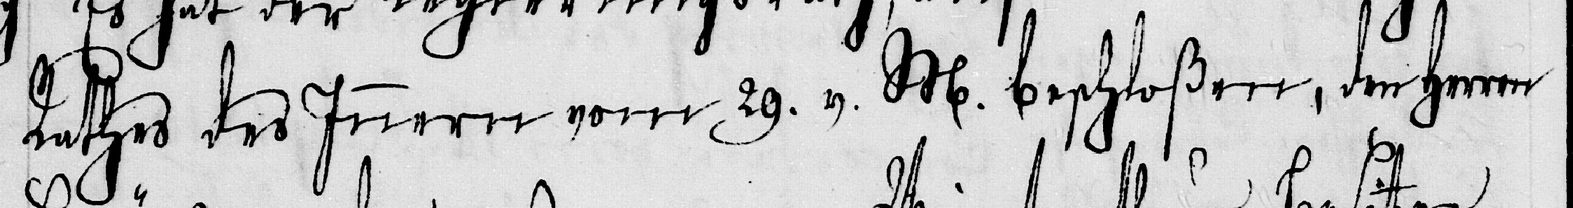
Rathes des Innern vom 29. v. M. beschloßen, den Herren
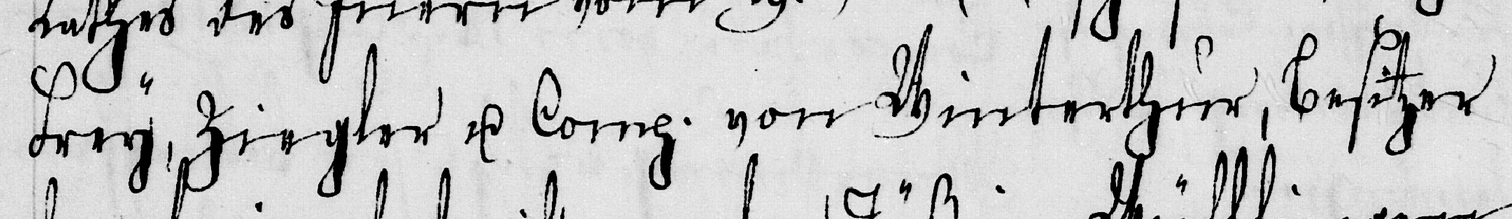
Frey, Ziegler & Comp. von Winterthur, Besitzer
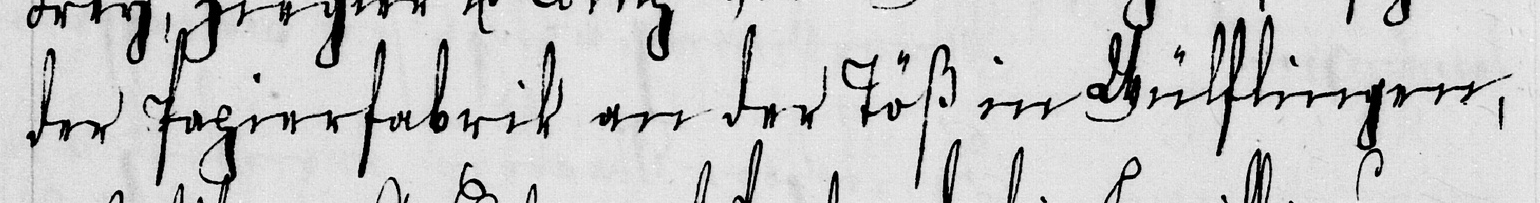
der Papierfabrik an der Töß in Wülflingen,
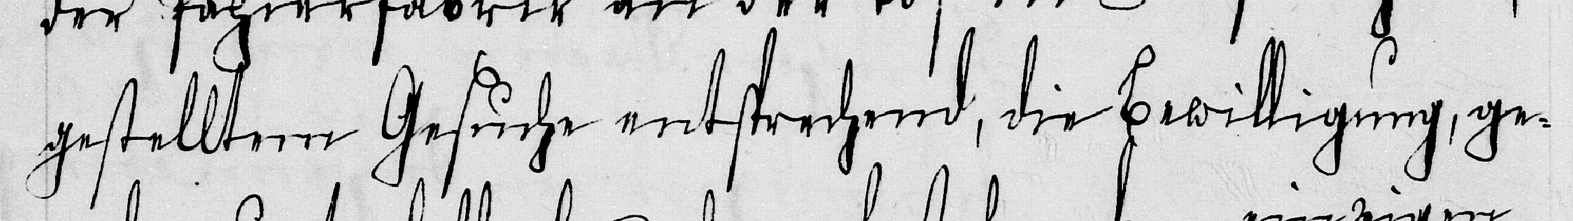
gestelltem Gesuche entsprechend, die Bewilligung, ge¬
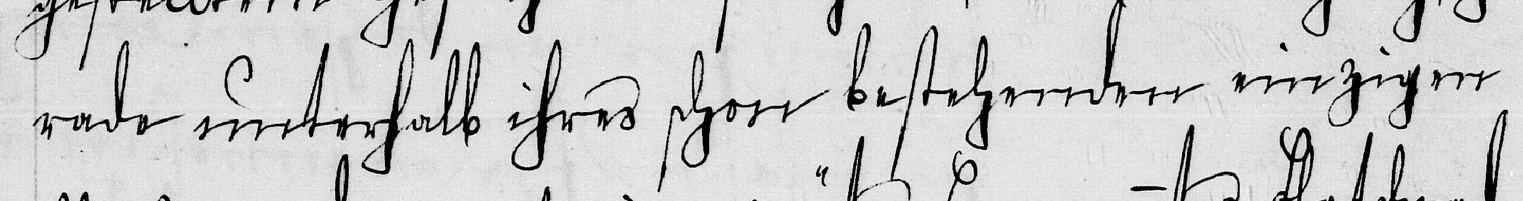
rade unterhalb ihres schon bestehenden einzigen
